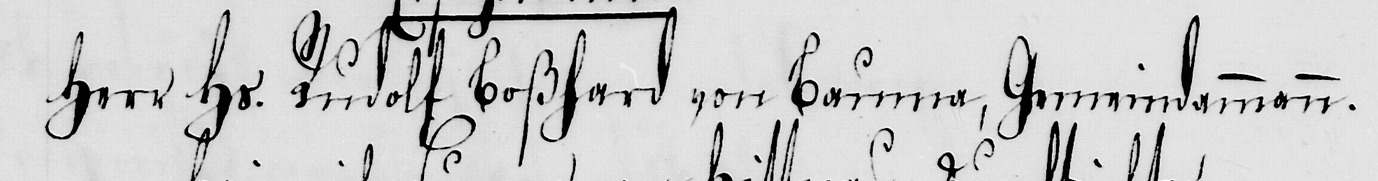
Herr Hs. Rudolf Boßhard von Bauma, Gemeindammann.
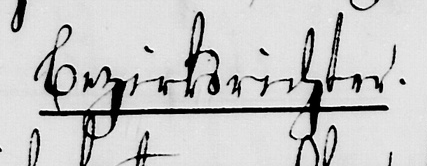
Bezirksrichter.
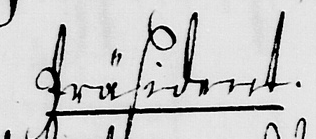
Präsident.
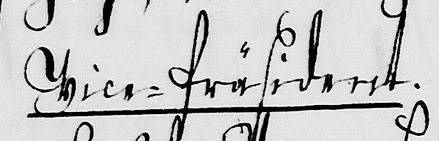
Vice-Präsident.
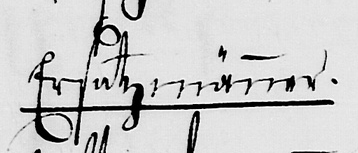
Ersatzmänner.
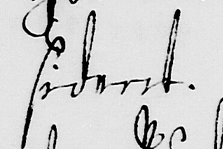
sident.
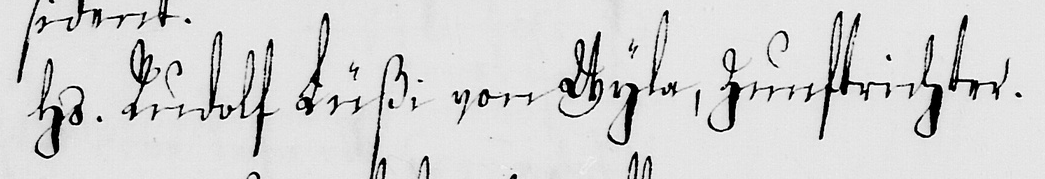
Hs. Rudolf Lüßi von Wyla, Zunftrichter.
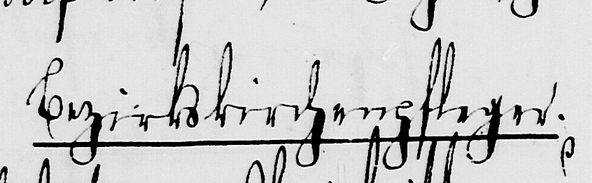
Bezirkskirchenpfleger.
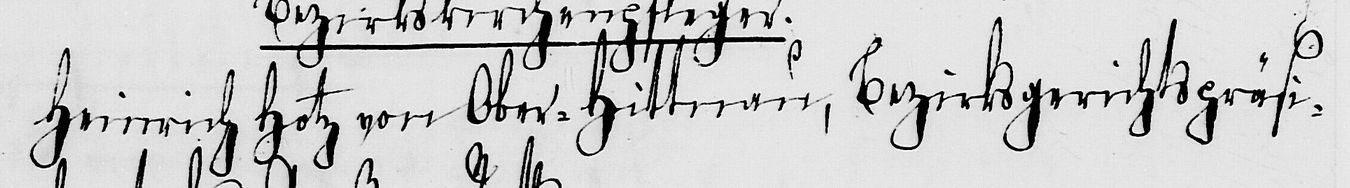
Heinrich Hotz von Ober-Hittnau, Bezirksgerichtspräsi¬
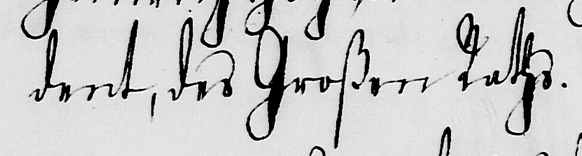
dent, des Großen Raths.
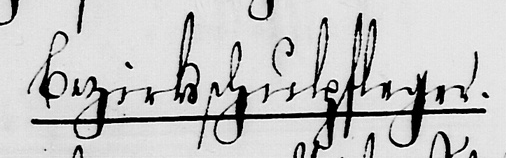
Bezirksschulpfleger.
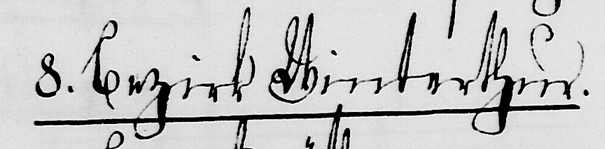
8. Bezirk Winterthur.
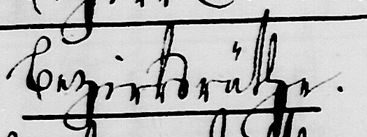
Bezirksräthe.
